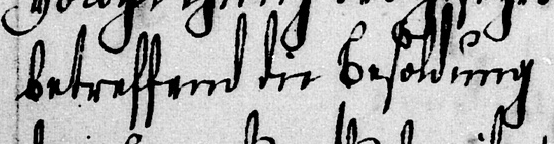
betreffend die Besoldung
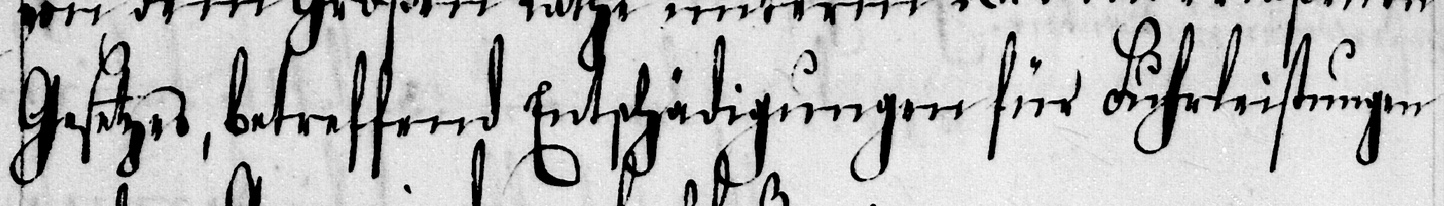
es, betreffend Entschädigungen für Fuhrleistung¬
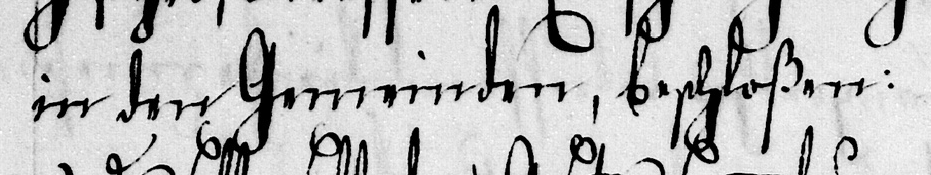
in den Gemeinden, beschloßen:
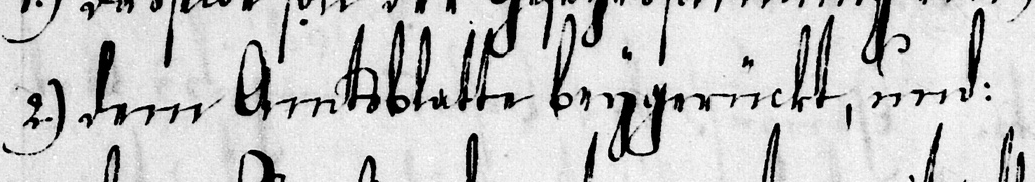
2.) dem Amtsblatte beygerückt, und
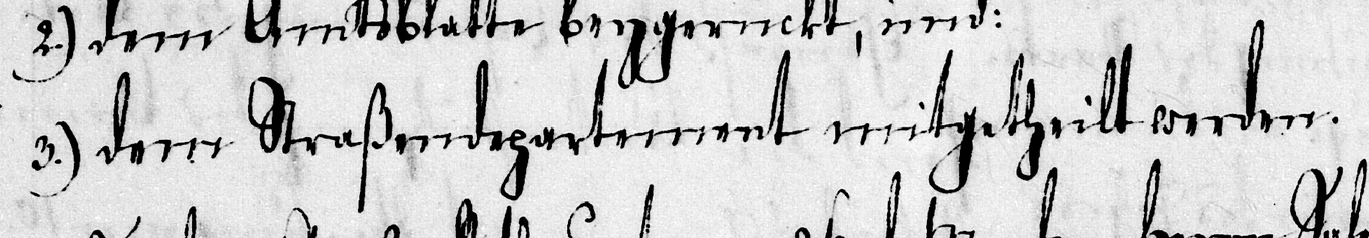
3.) dem Straßendepartement mitgetheilt werden.
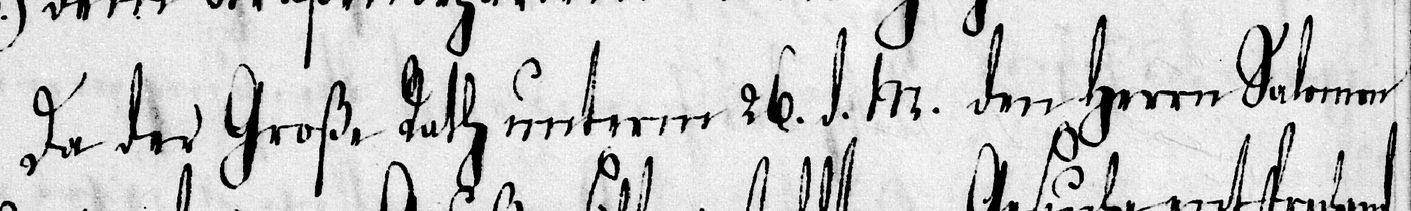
Da der Große Rath unterm 26. d. M. den Herrn Salomon
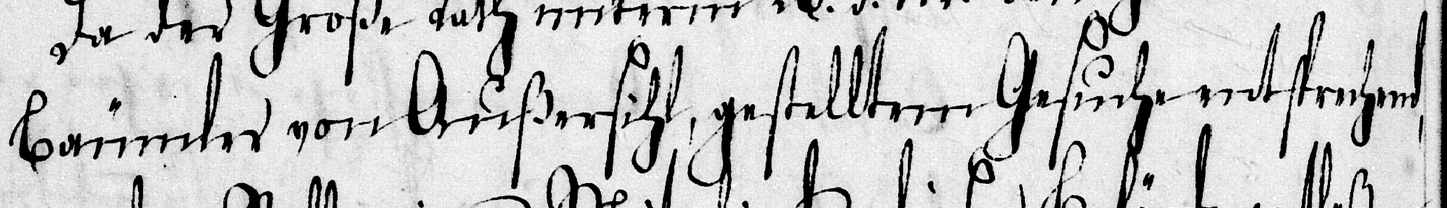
Bäumler von Außersihl, gestelltem Gesuche entspreche¬
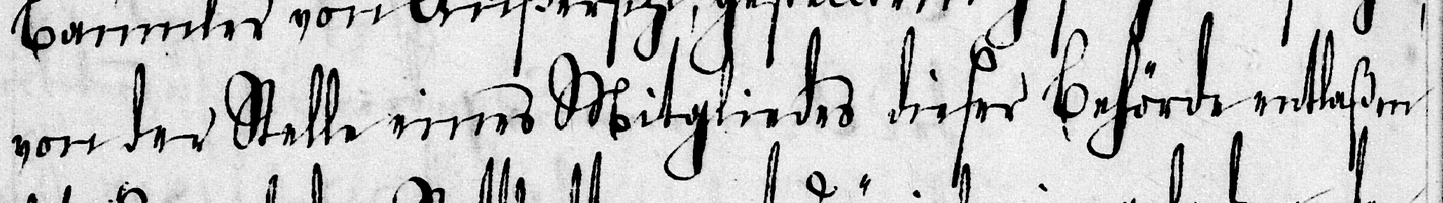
von der Stelle eines Mitgliedes dieser Behörde entlaßen
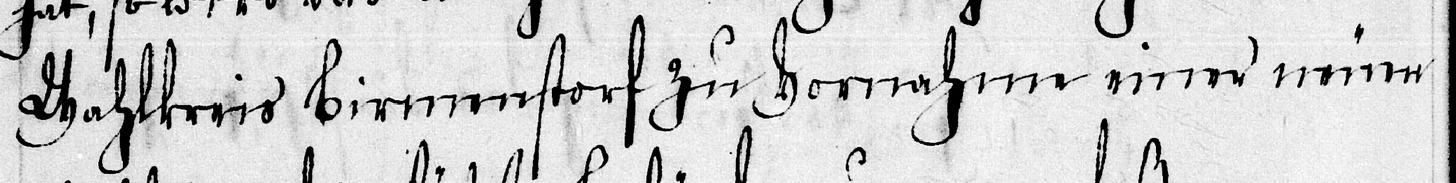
Wahlkreis Birmenstorf zu Vornahme einer neuen
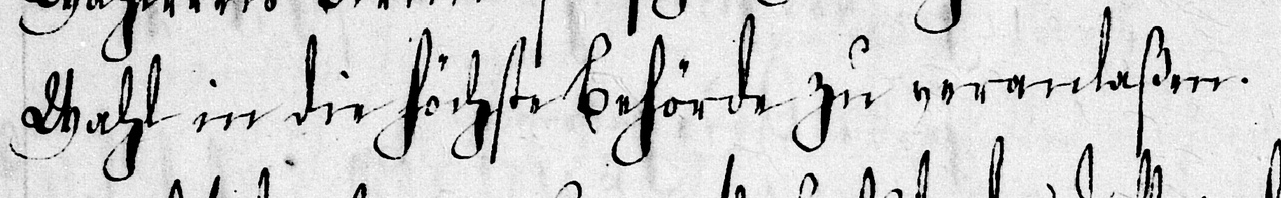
Wahl in die höchste Behörde zu veranlaßen.
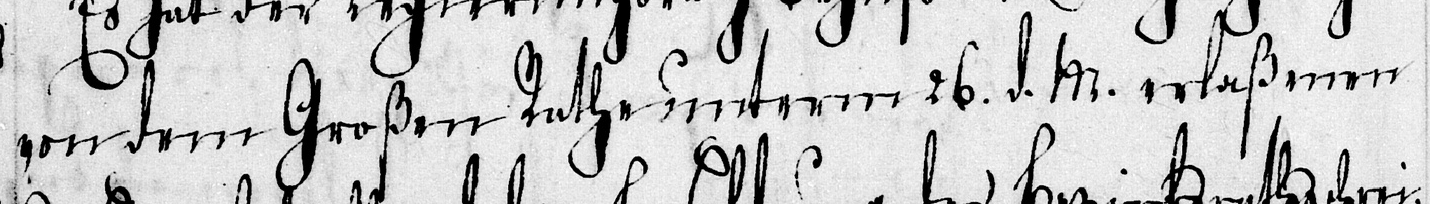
von dem Großen Rathe unterm 27. d. M. erlaßenen
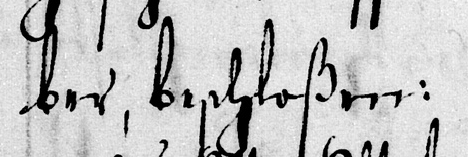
ber, beschloßen:
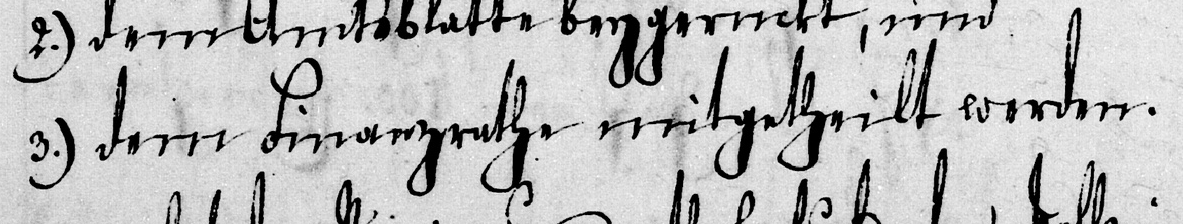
3.) dem Finanzrathe mitgetheilt werden.
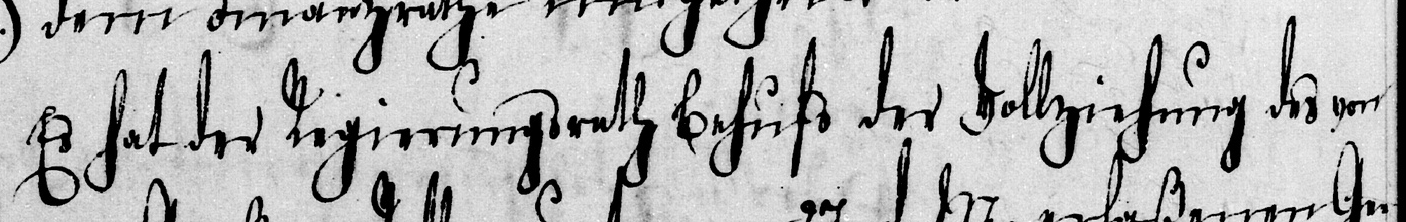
Es hat der Regierungsrath Behufs der Vollziehung des
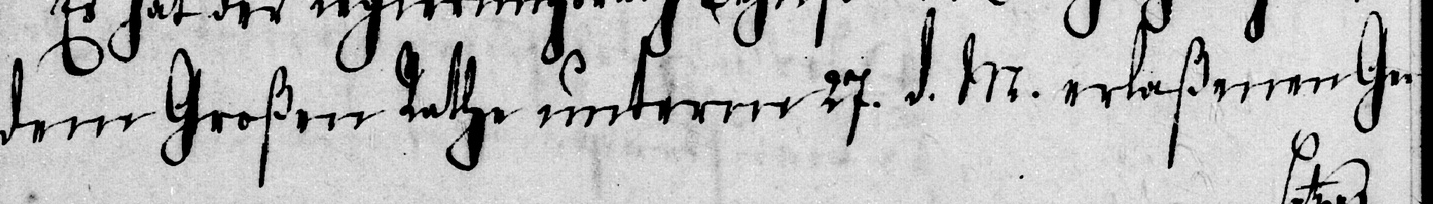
dem Großen Rathe unterm 28. d. M. erlaßenen Ge¬
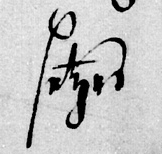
setzes
